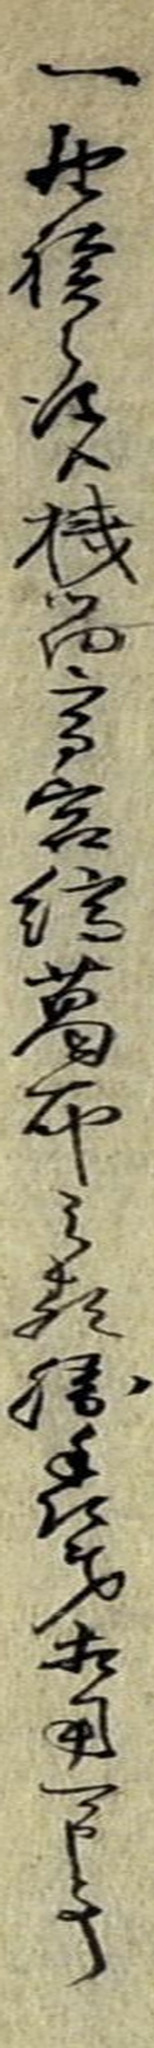一野袴之儀ハ桟留高宮縞葛布之類勝手次第相用可申事
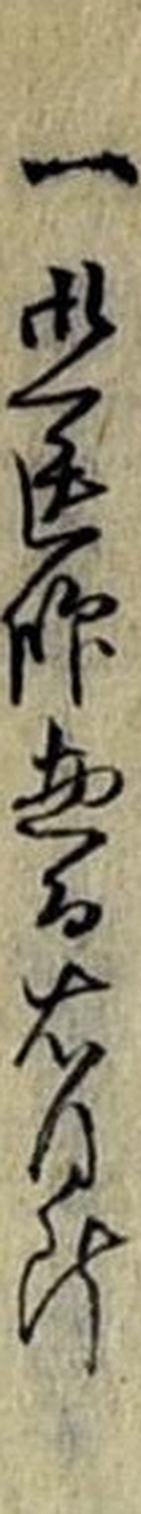一御医師惣而右同断
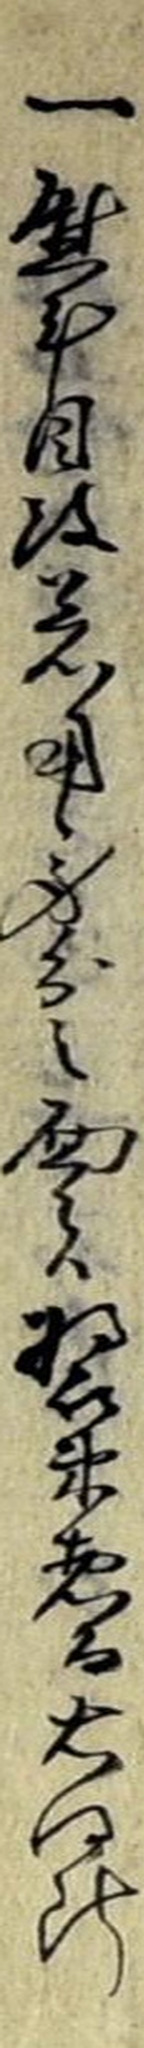一熨斗目着用候身分之面々ハ装束惣而右同断
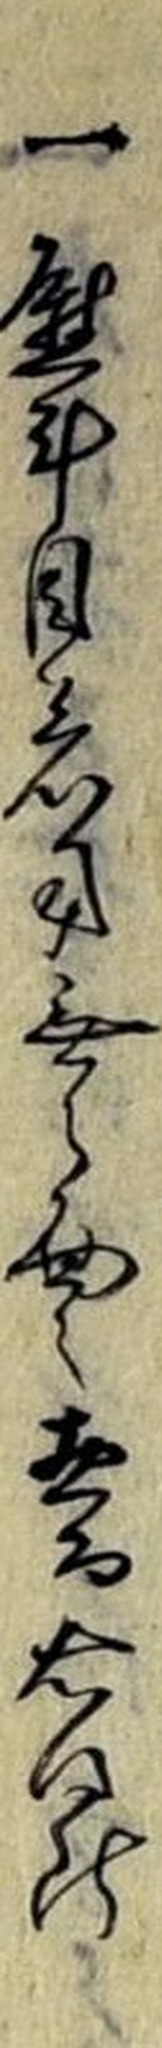一熨斗目着用無之面々惣而右同断
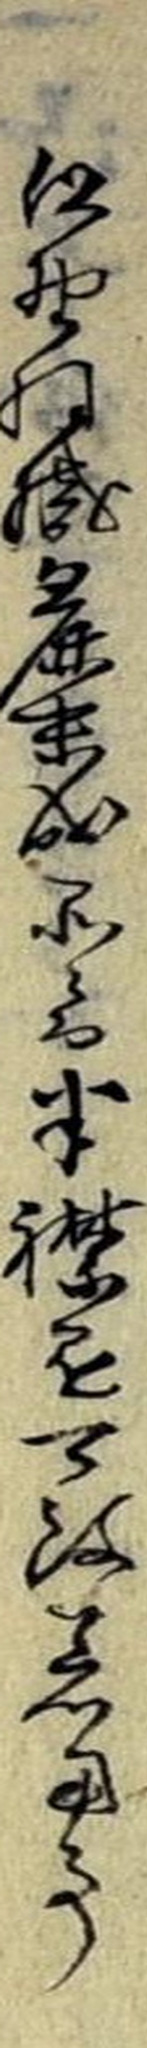但野羽織麁末成品ニ而半襟懸可致着用事
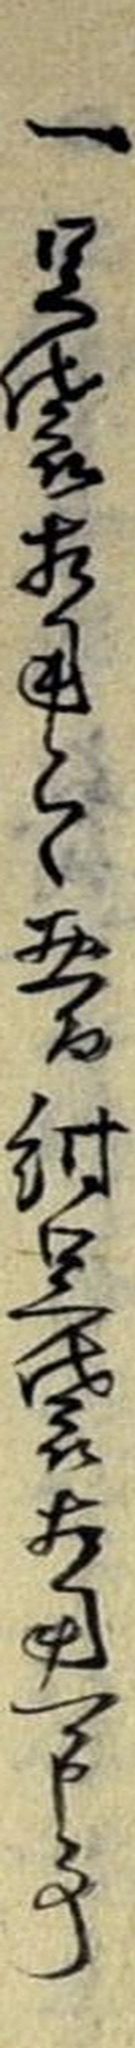一足袋相用候ハヽ惣而紺足袋相用可申事
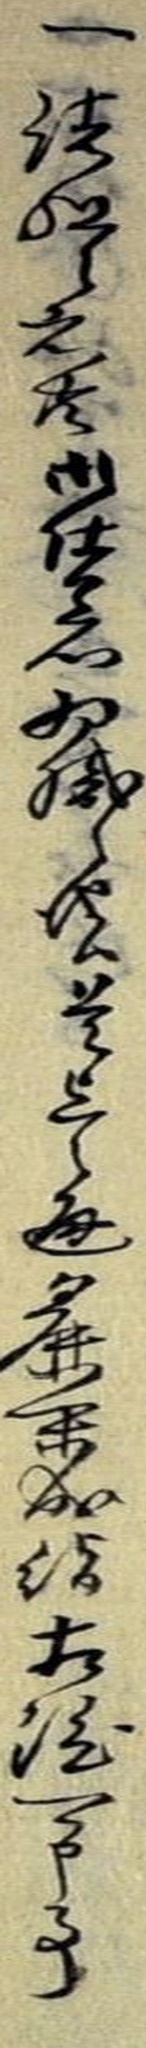一諸組之者共御仕着羽織之儀ハ是迄之通麁末成絹相渡可申事
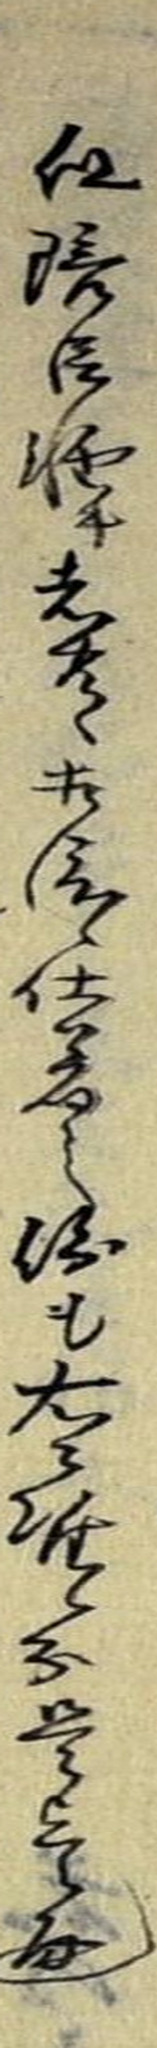但陪臣軽キ者共へ相渡候仕着之儀も右ニ准候分是迄之通
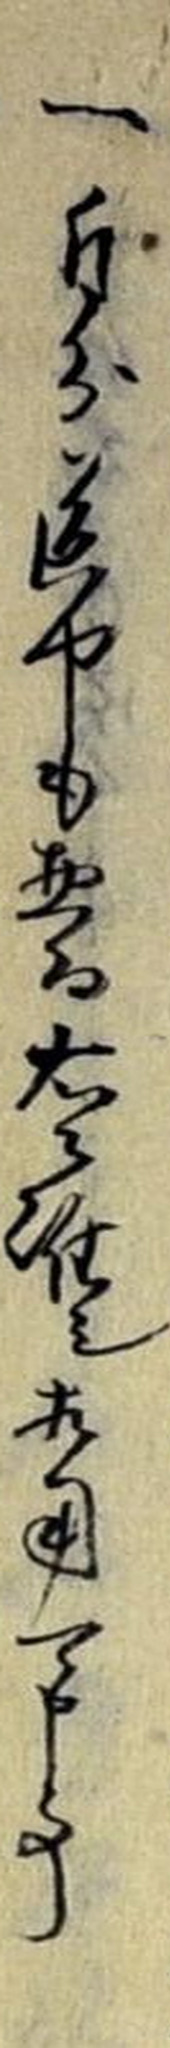一自分道中も惣而右ニ准シ相用可申事
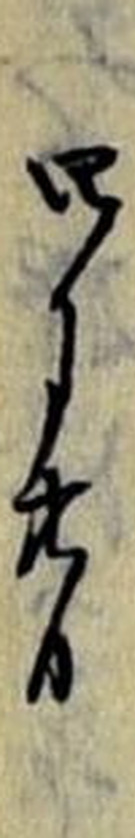四月廿日
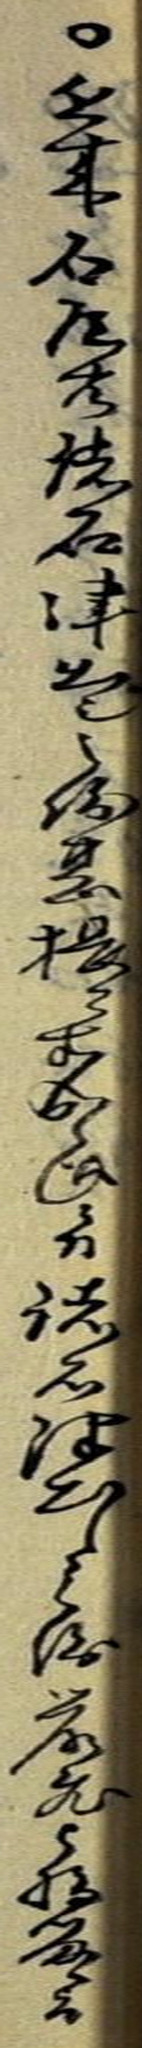〇近来石屋共諸石津出シ之儀甚猥ニ相成候趣ニ付諸石津出し之儀厳敷被指留候旨
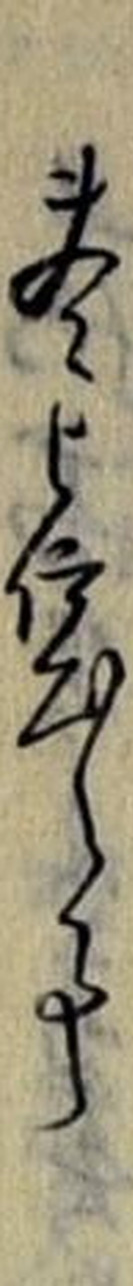夫々被仰出候事
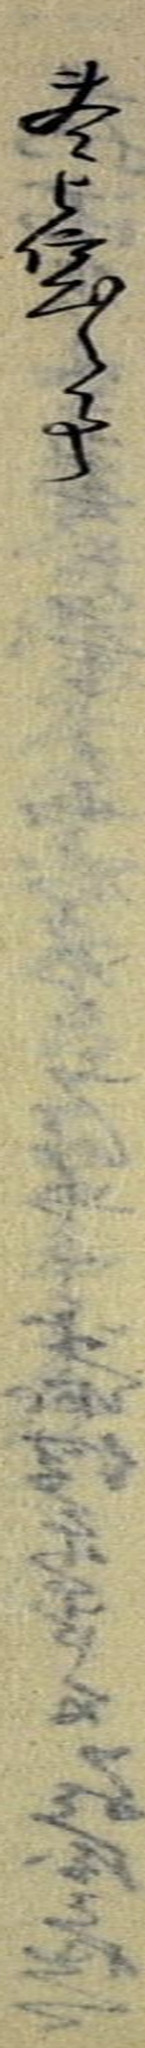夫々被仰出候事
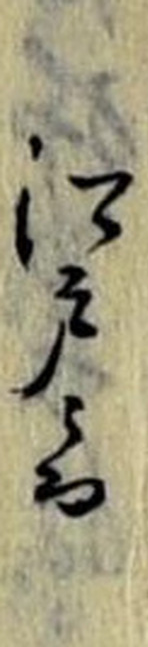江戸ニ而
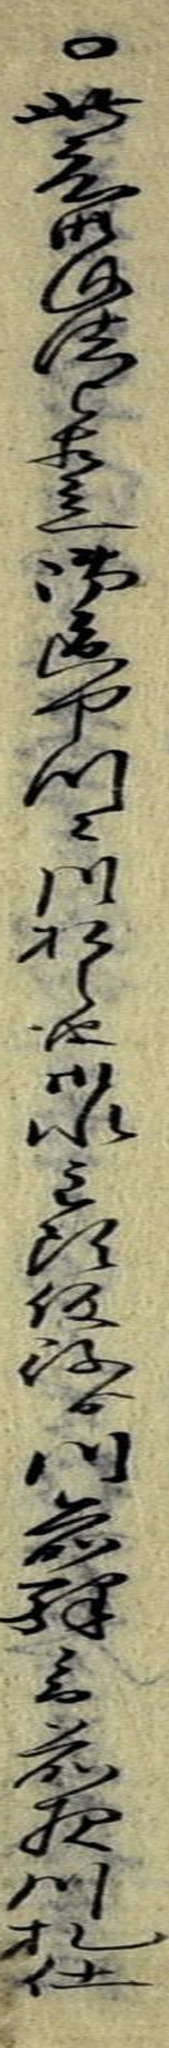〇此度御趣法被相立御道中川々川札之儀御水主頭仮役ゟ川前駅ニ而前夜川札仕
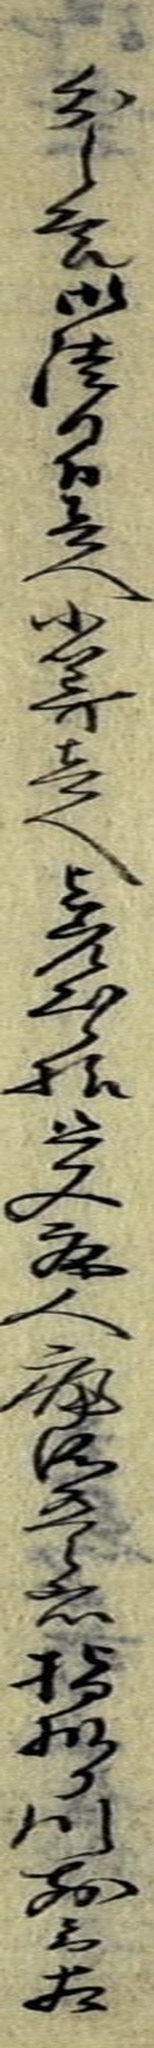分之節御徒目付壱人小算壱人被差出候様且又病人痛所有之者指掛り川前ニ而相
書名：命令之部 三
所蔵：福井県文書館 Fukui Prefectural Archives
